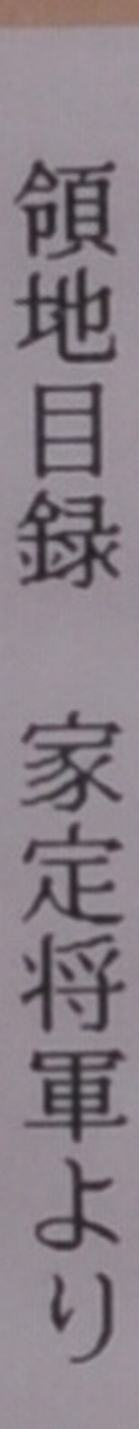領地目録家定将軍より
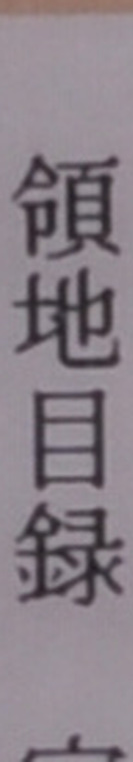領知目録
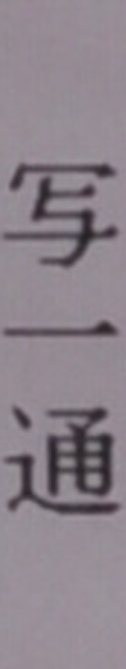写一通
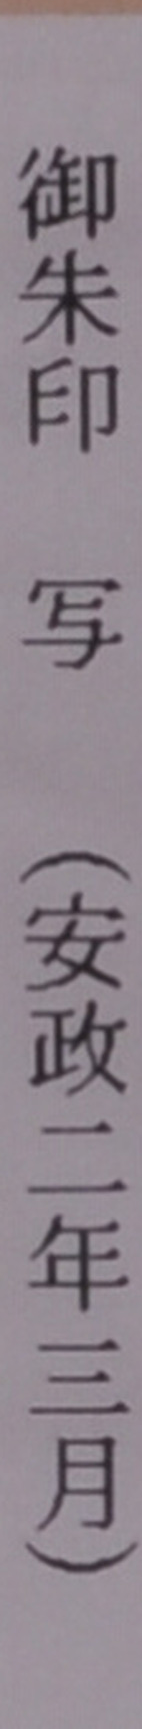御朱印写(安政二年三月)
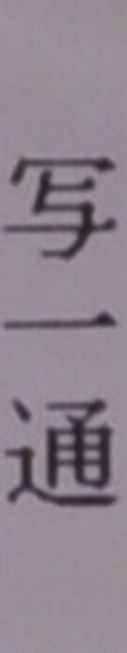写一通
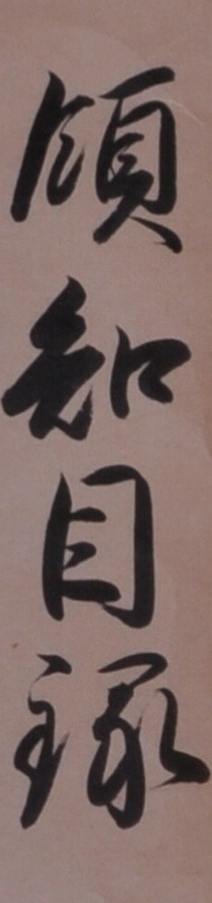領知目録
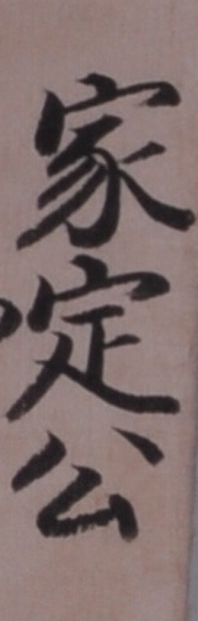家定公
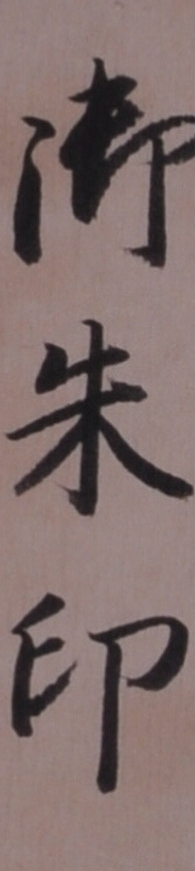御朱印
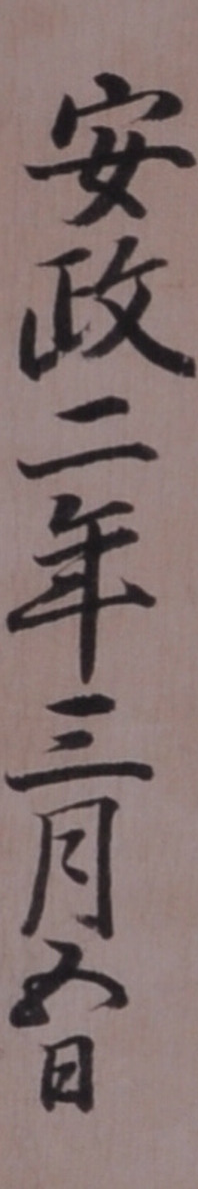安政二年三月五日
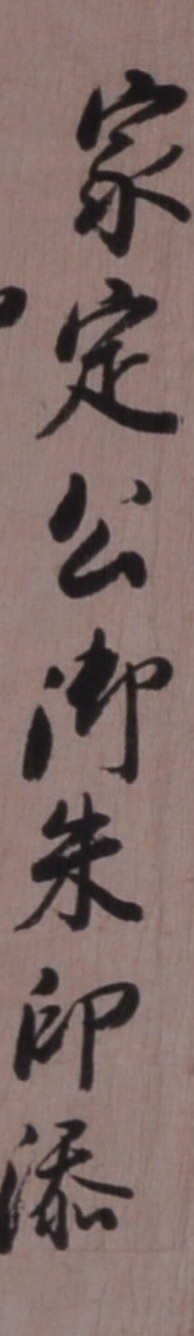家定公御朱印添
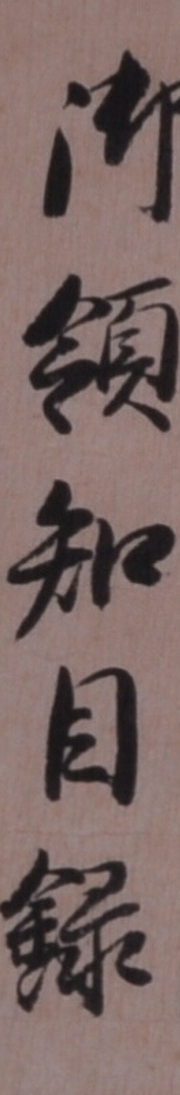御領知目録
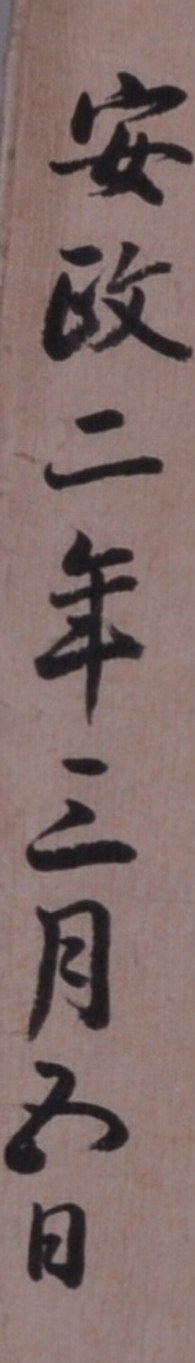安政二年三月五日

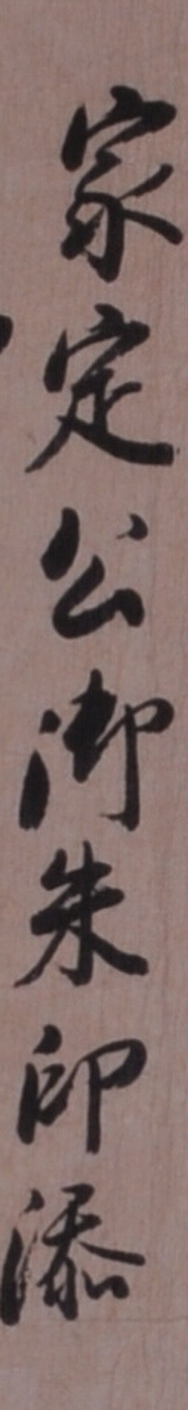家定公御朱印添
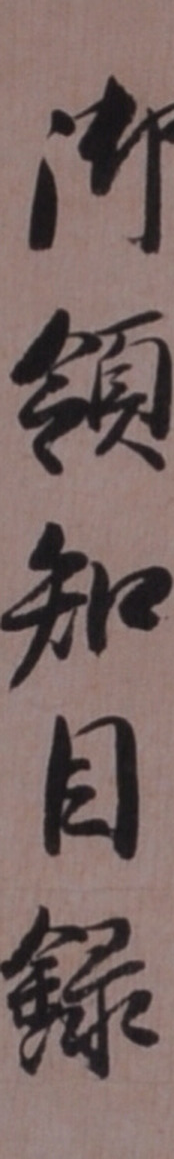御領知目録
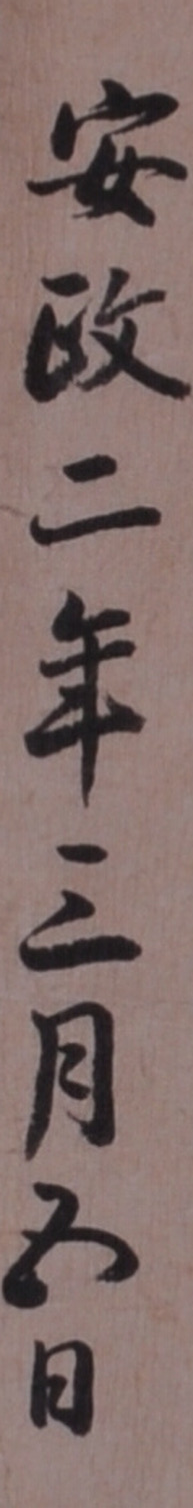安政二年三月五日
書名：御朱印写・領地目録
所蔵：伊那市立高遠町図書館・合同会社AMANE
